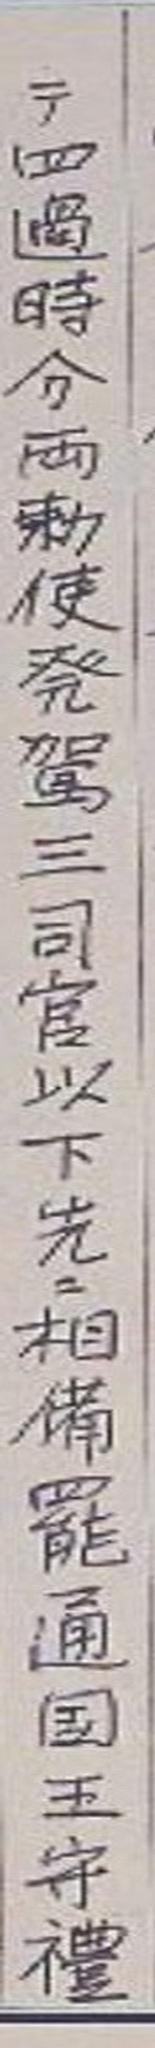て四過時分両勅使発駕三司官以下先に相備罷通国王守礼
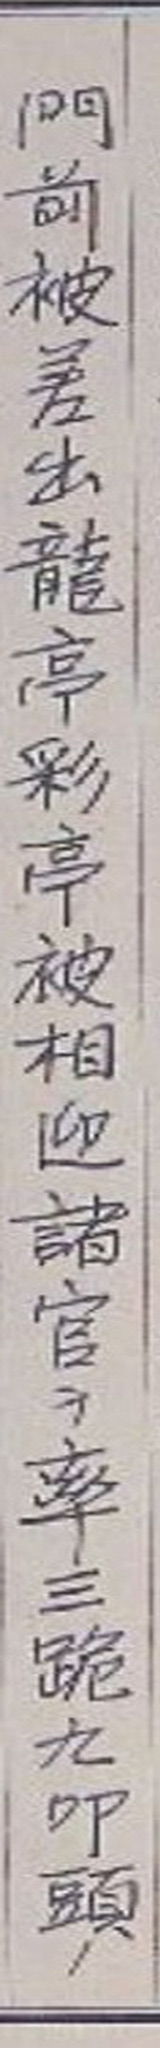門前被差出龍亭彩亭被相迎諸官を率三跪九叩頭の
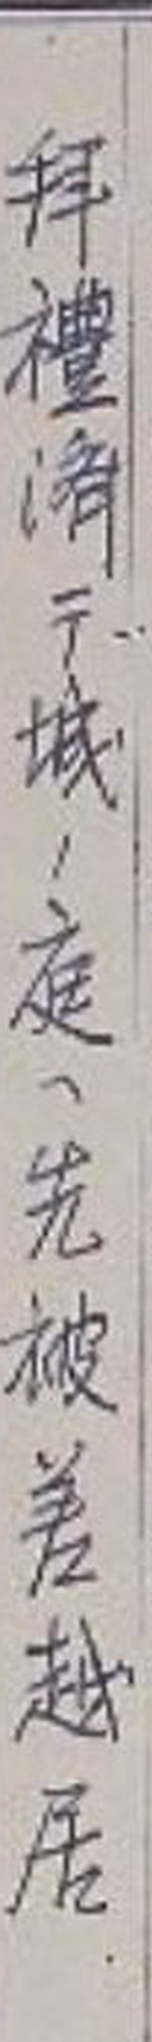拝礼済て城の庭へ先被差越居

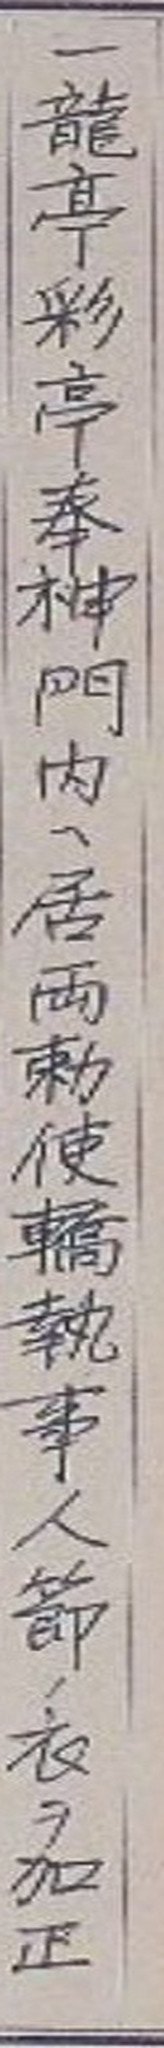一龍亭彩亭奉神門内へ居両勅使轎執事人節の衣を加正
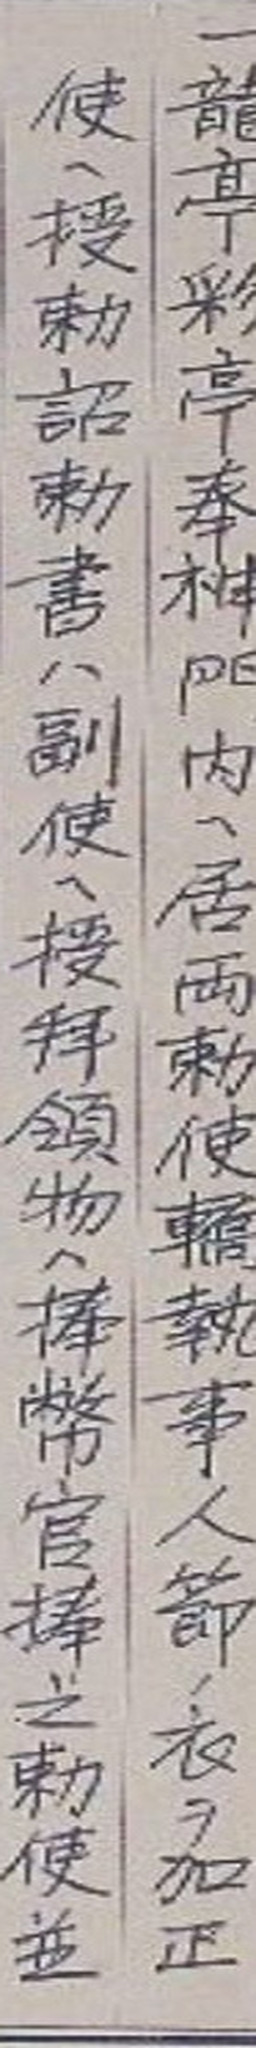使へ授勅詔勅書は副使へ授拝領物は奉幣官捧之勅使並
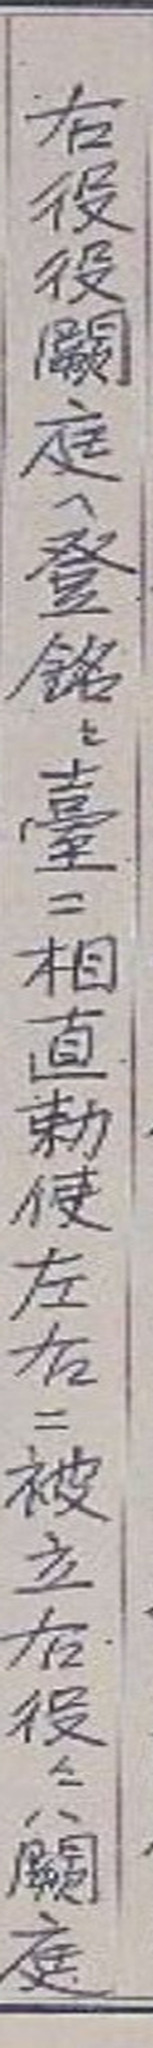右役役闕庭へ登銘々台に相直勅使左右に被立右役々は闕庭
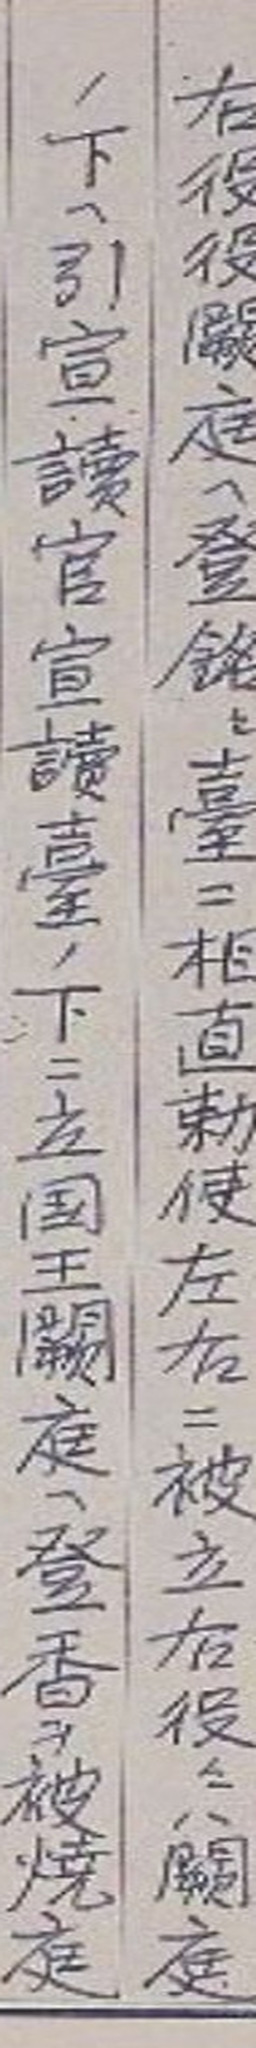の下へ引宣読官宣読台の下に立国王闕庭へ登香を被焼庭
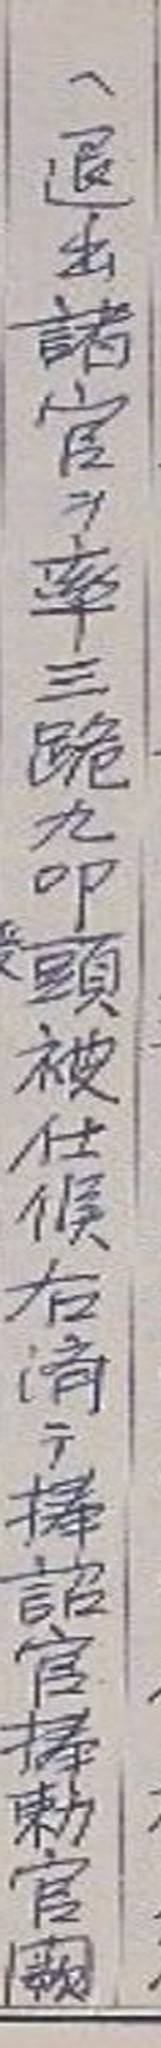へ退出諸官を率三跪九叩頭被仕候右済て捧詔官捧勅官闕
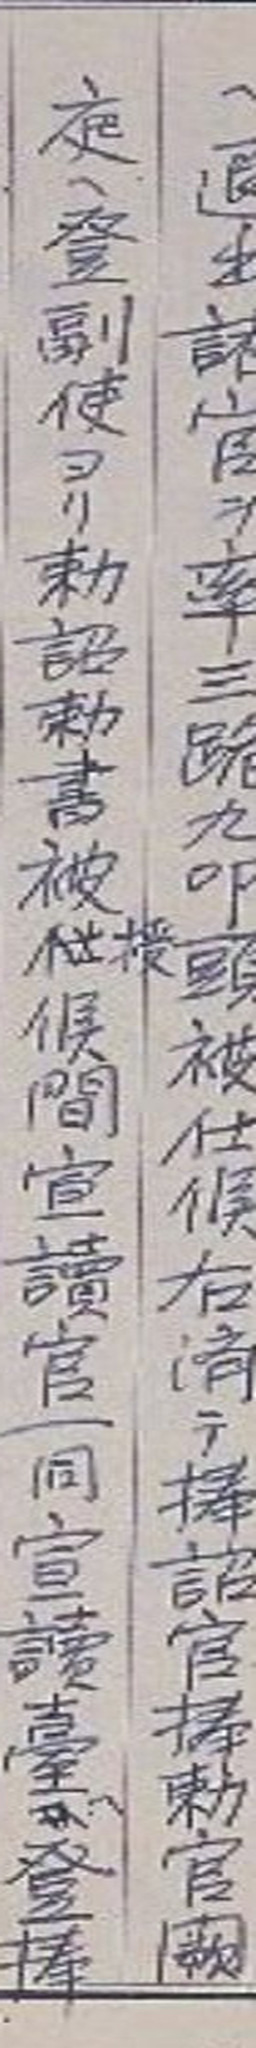庭へ登副使より勅詔勅書開展宣読官一同宣読台へ登捧
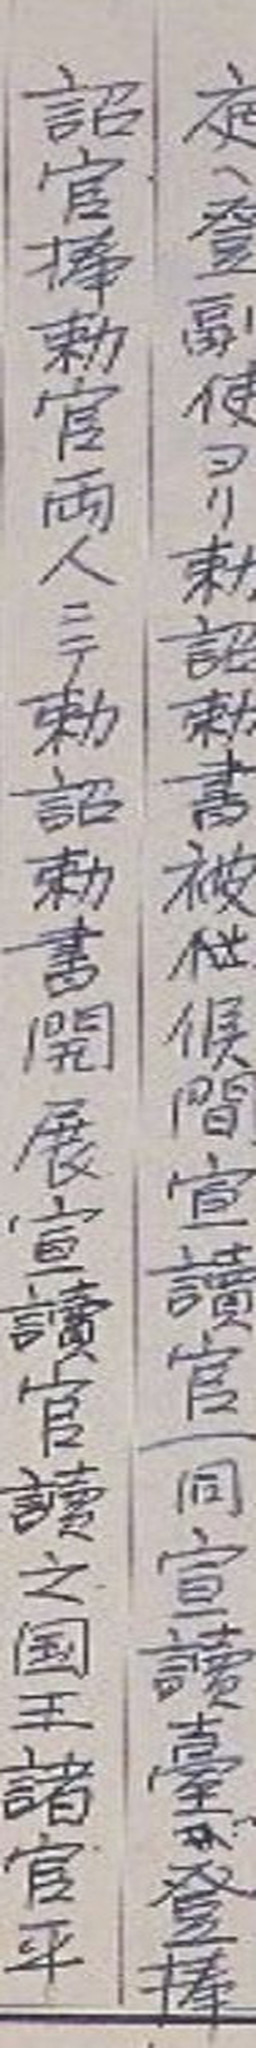詔官捧勅官両人にて勅詔勅書開展宣読官読之国王諸官平
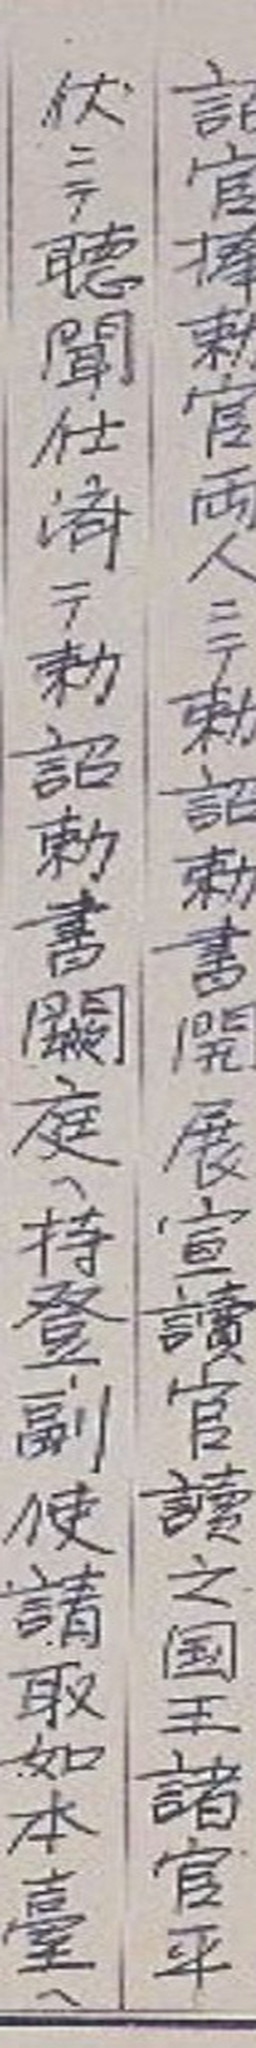伏にて聴聞仕済て勅詔勅書闕庭へ持登副使請取如本台へ
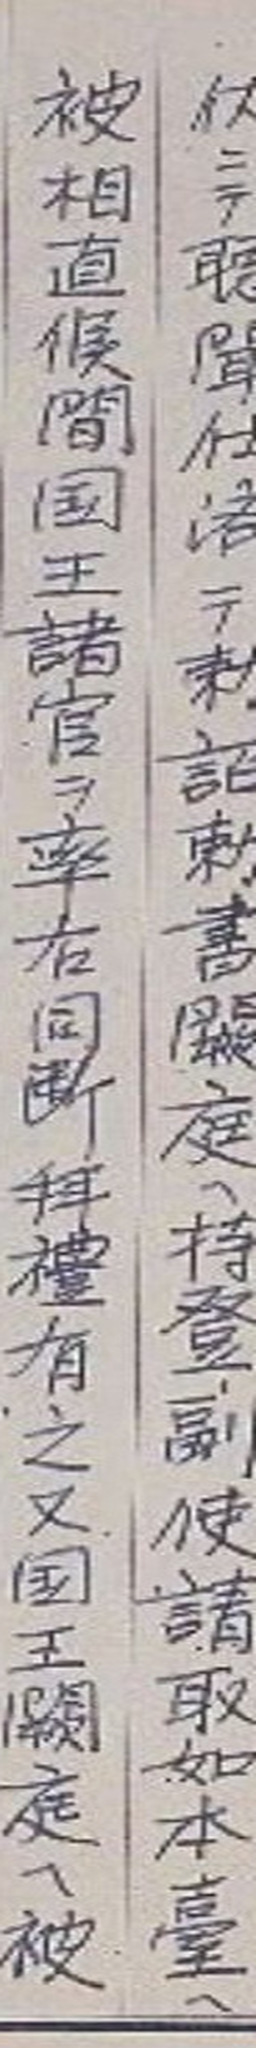被相直候間国王諸官を率右同断拝礼有之又国王闕庭へ被
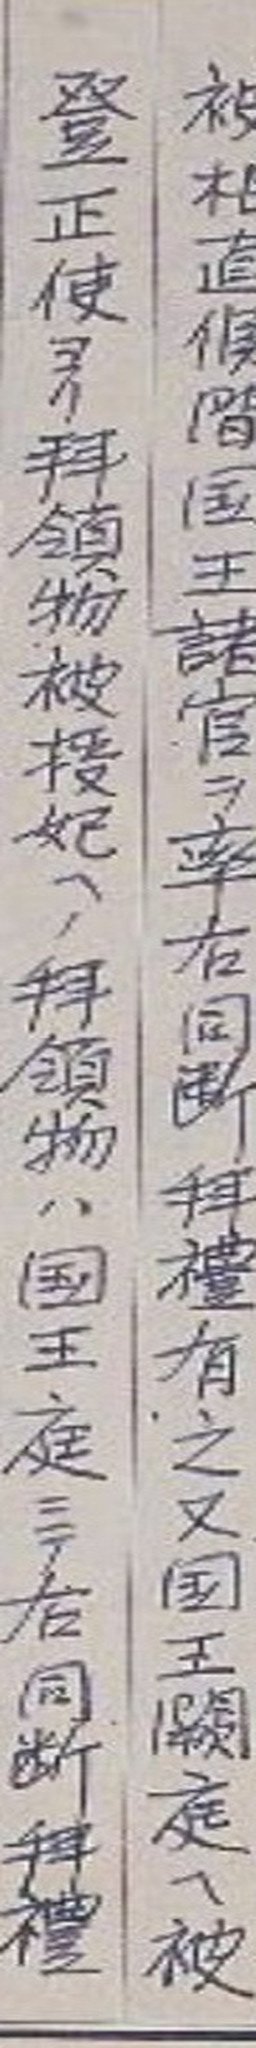登正使より拝領物被授妃への拝領物は国王庭にて右同断拝礼
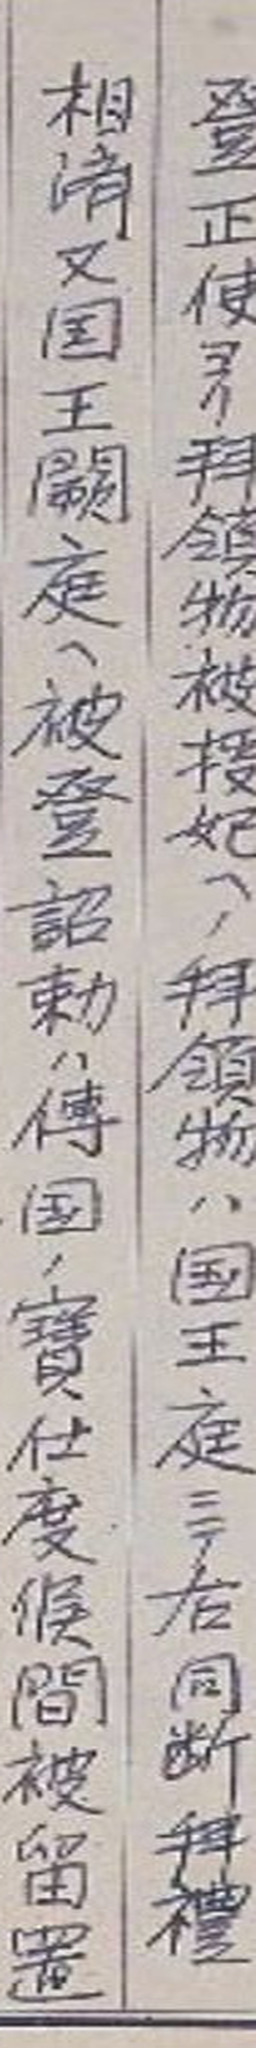相済又国王闕庭へ被登詔勅は伝国の宝仕度候間被留置
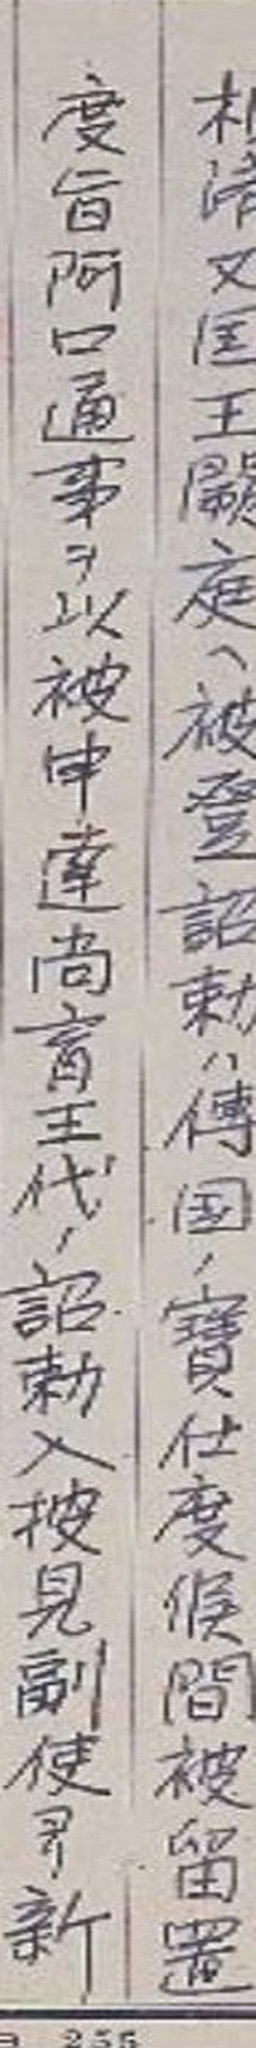度旨阿口通事を以被申達尚育王代の詔勅入披見副使より新
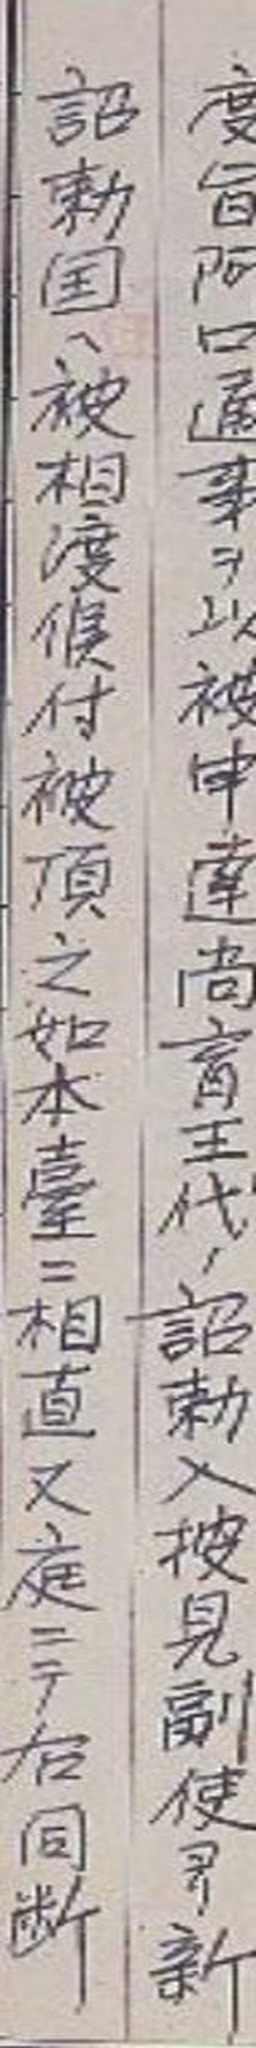詔勅国へ被相渡候付被頂之如本台に相直又庭にて右同断
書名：支那冊封使来琉諸記 下巻
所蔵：University of the Ryukyus Library
